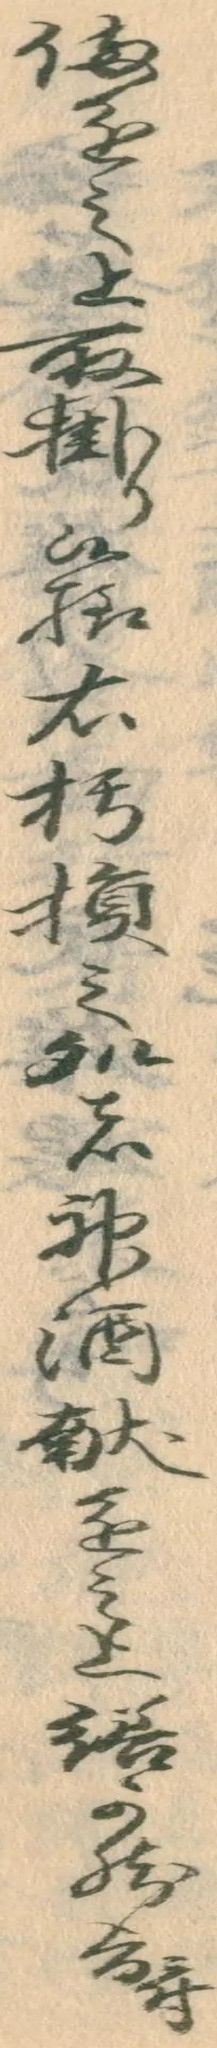備進之上取掛り候様右朽損之処は神酒献進之上繕可然旨ニ付
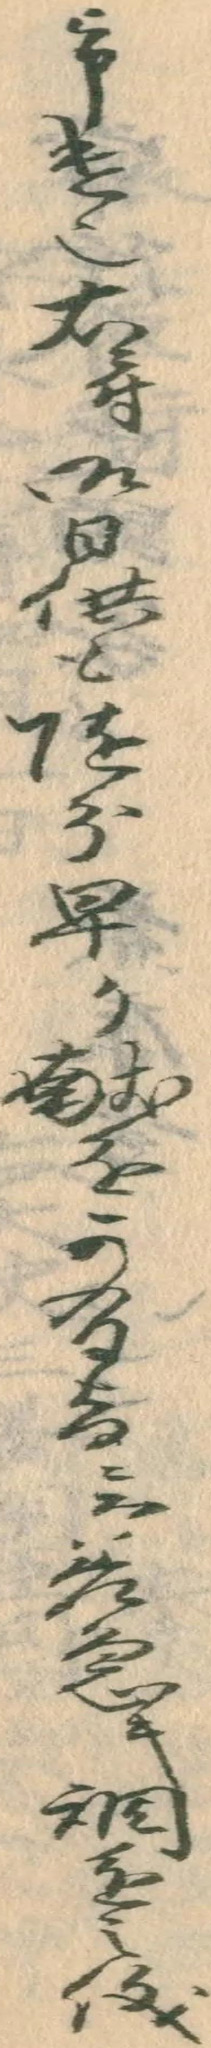被申遣也右ニ付御日供も随分早ク献進可有旨ニ而差急キ調進之儀
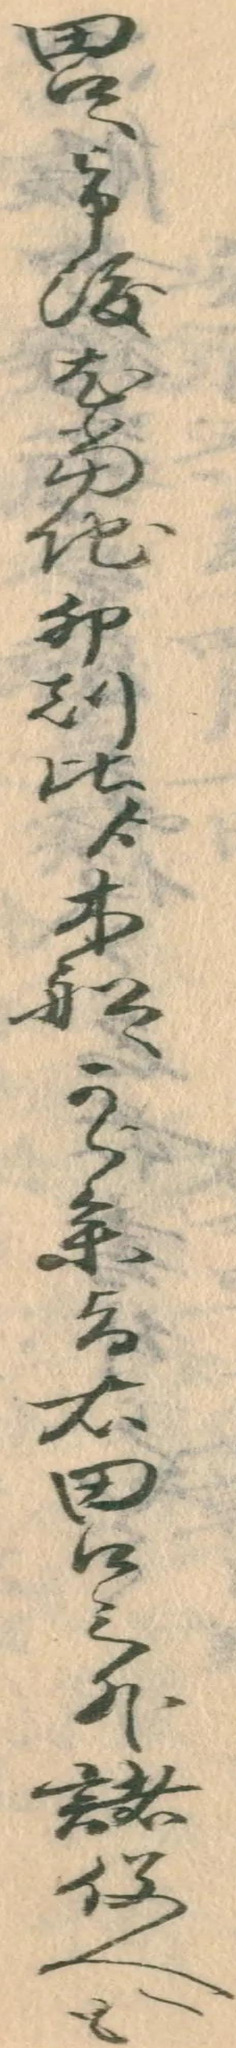田口へ被申渡尤当地卯刻比ゟ木船へ可被参旨右田口之外諸役人へも
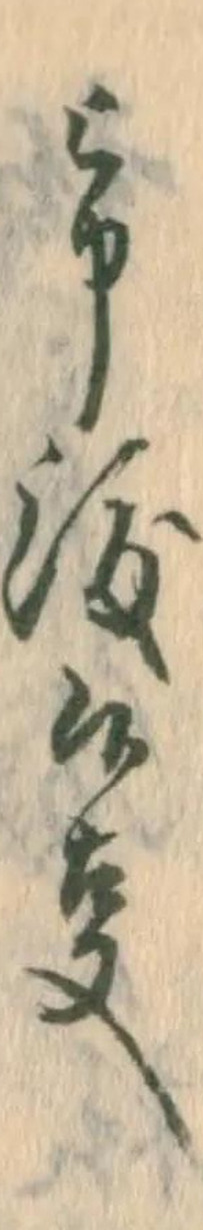被申渡候事
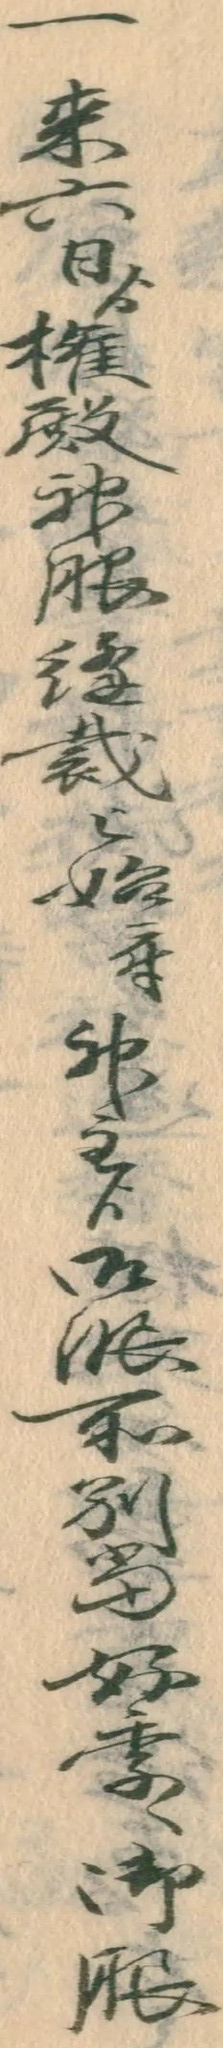一来六日ゟ権殿神服縫裁被始ニ付神主ゟ御服所別当好季へ御服
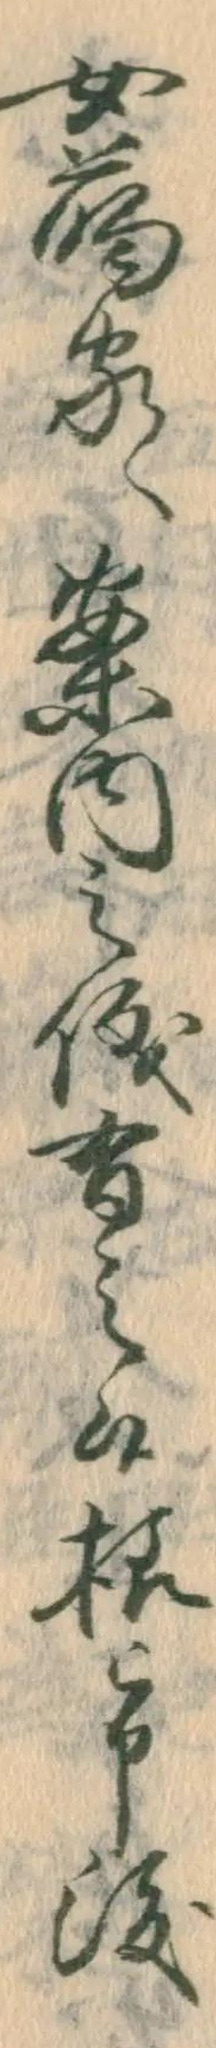女臈家へ案内之儀有之候様被申渡
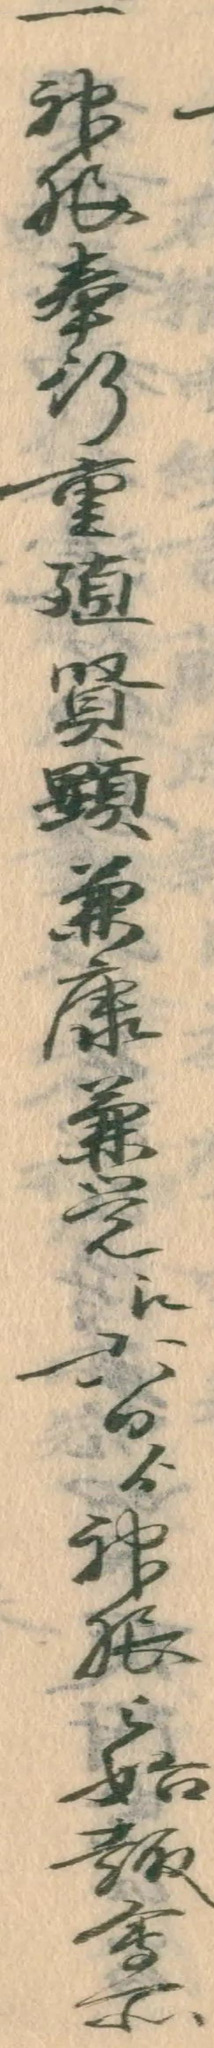一神服奉行重殖賢顕兼康兼覚江六日ゟ神服被始趣会所
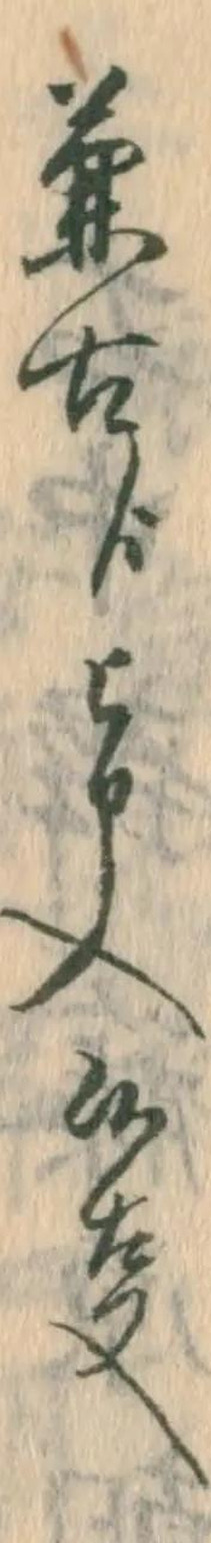兼古ゟ被申入候事
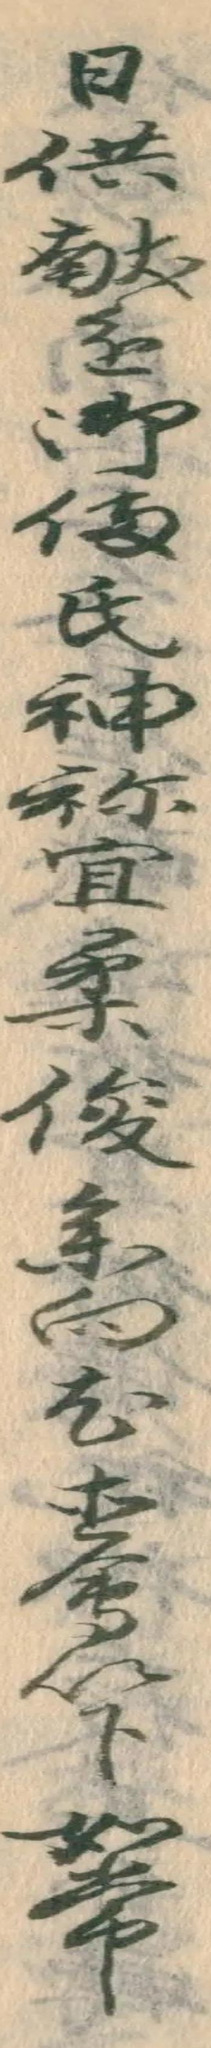日供献進御備氏神祢宜柔俊参向尤直会以下如常
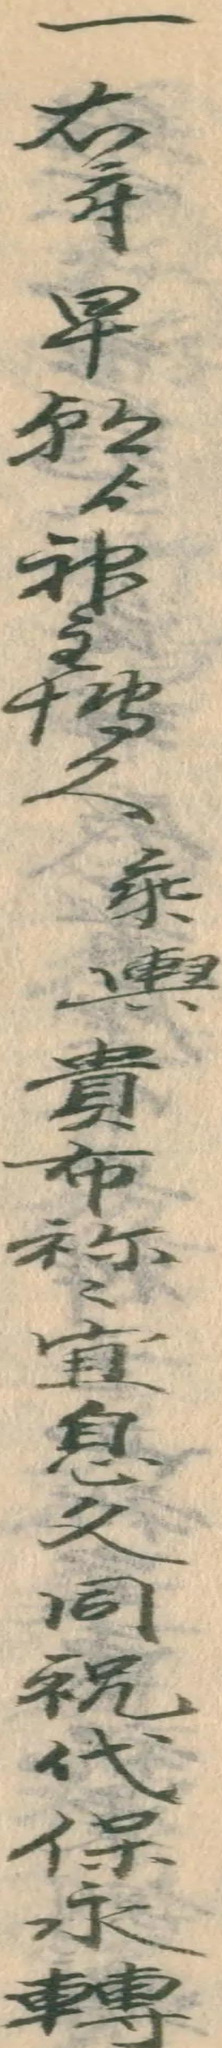一右ニ付早朝ゟ神主博久乗輿貴布祢々宜息久同祝代保永転
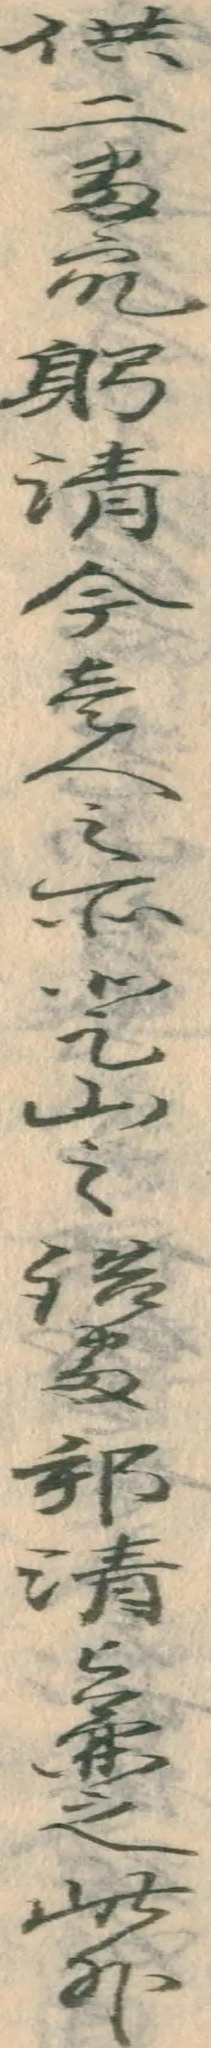供二番衆躬清今壱人之所登山之詰番邦清被兼之此外
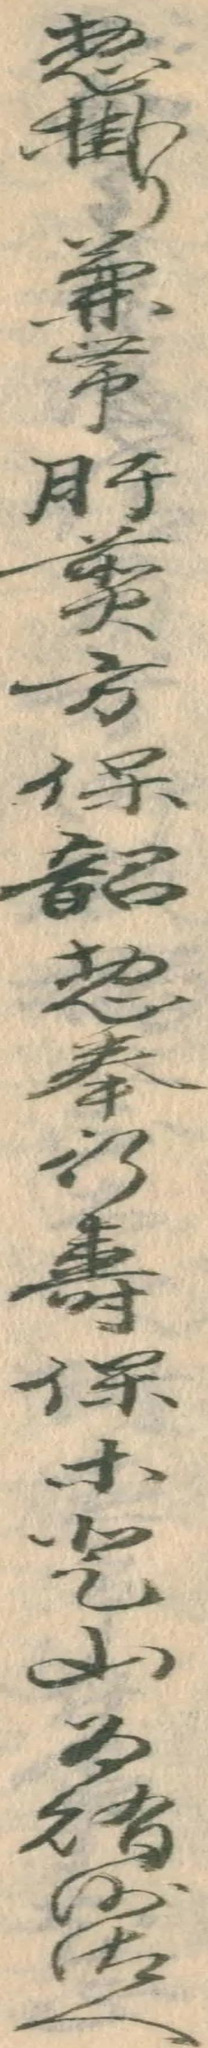惣掛リ兼帯肝煎方保韶惣奉行寿保等登山為賄沙汰人
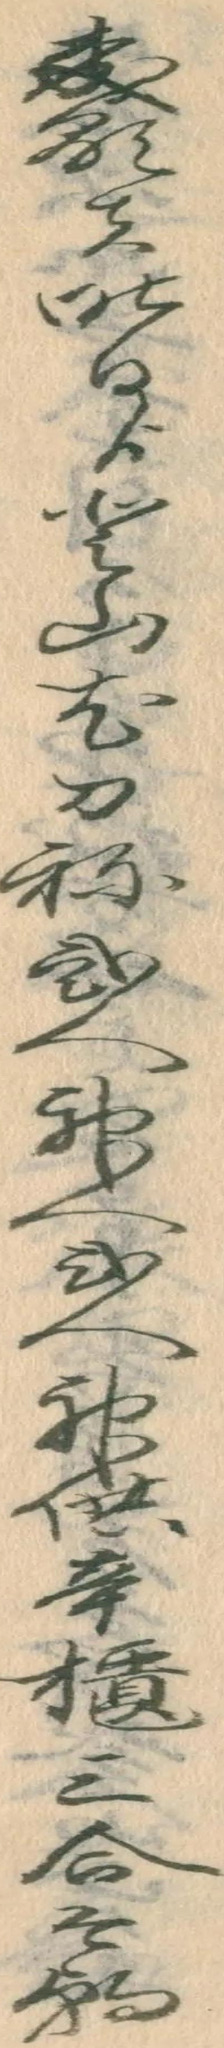森顕は昨日ゟ登山尤刀祢弐人神人弐人神供辛櫃三合今朝
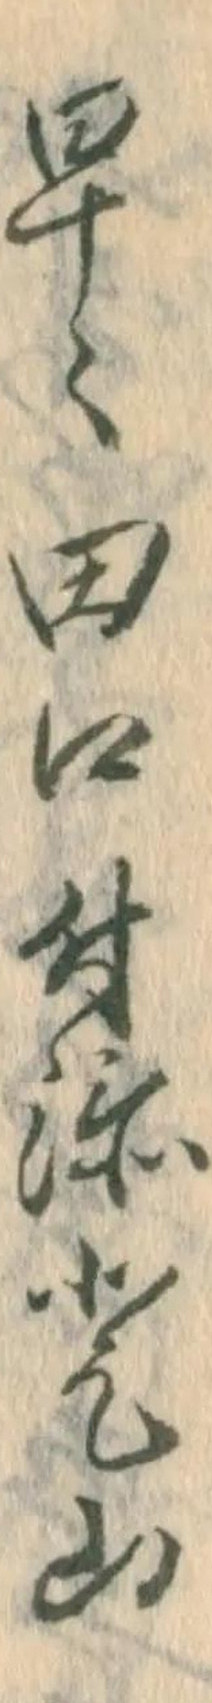早々田口付添登山
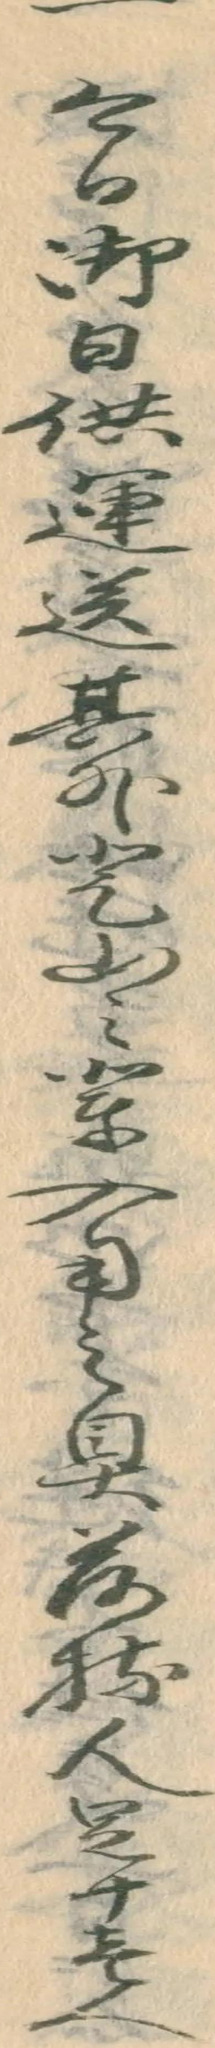一今日御日供運送其外登山之輩入用之具荷持人足十壱人
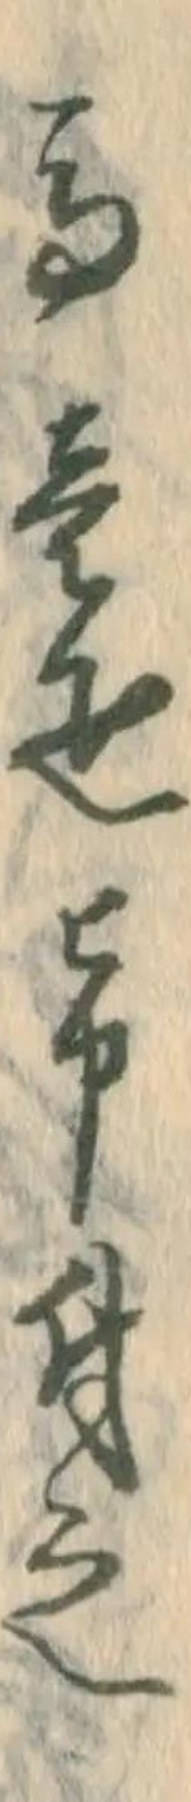馬壱疋被申付之
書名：賀茂社記録. 第17冊
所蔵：国立国会図書館 National Diet Library, JAPAN
